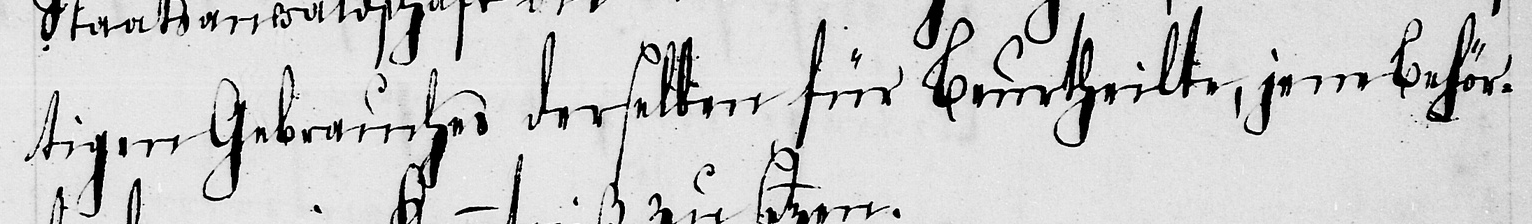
tigen Gebrauches derselben für Beurtheilte, jene Behör¬
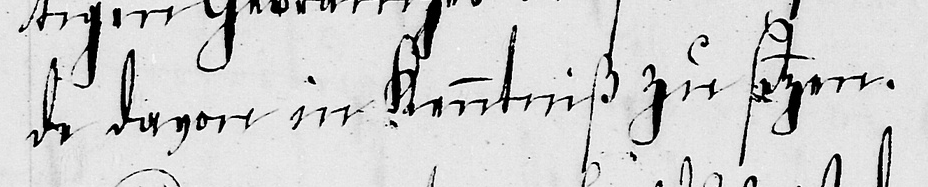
de davon in Kenntniß zu setzen.
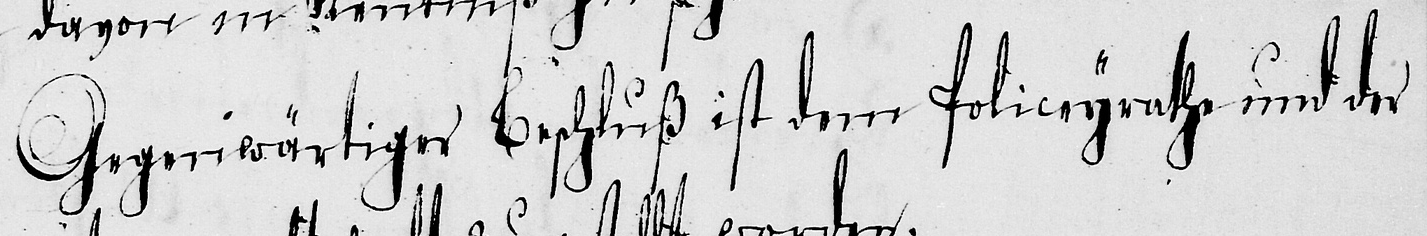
Gegenwärtiger Beschluß ist dem Policeyrathe und der
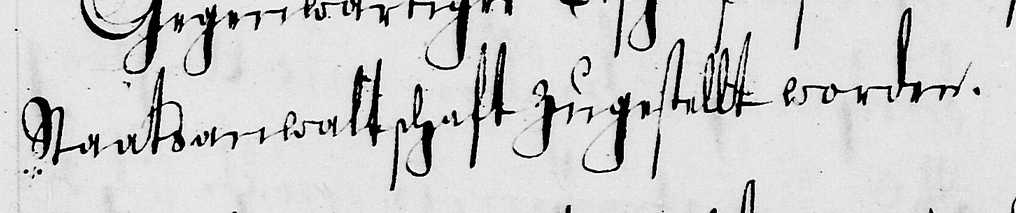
Staatsanwaltschaft zugestellt worden.
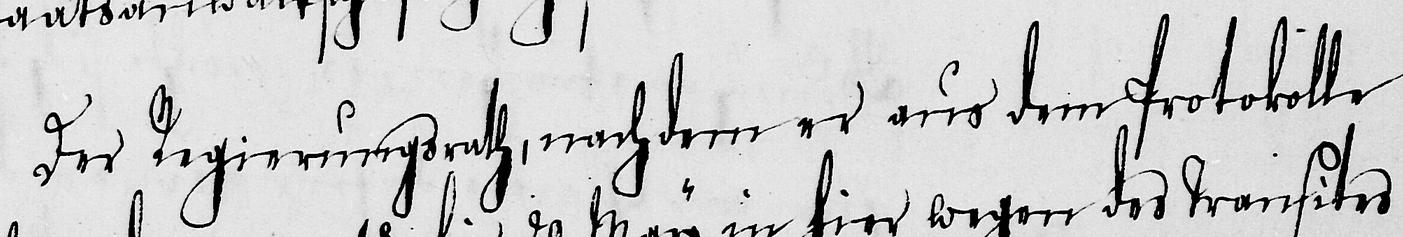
Der Regierungsrath, nachdem er aus dem Protokolle
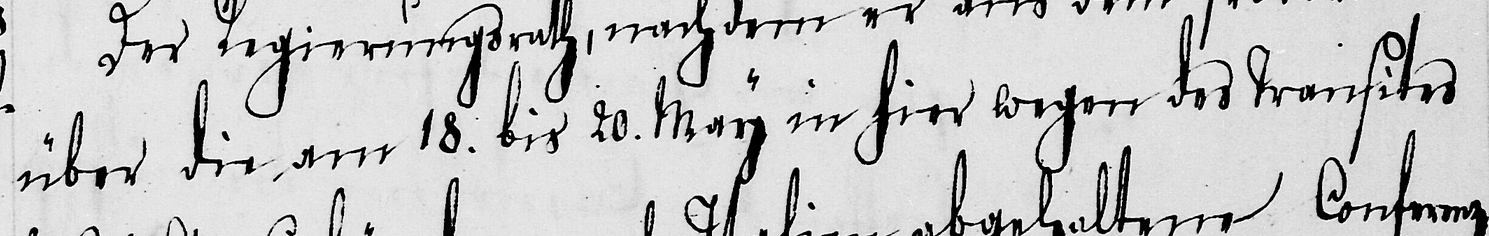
über die am 18. bis 20. May in hier wegen des Transites
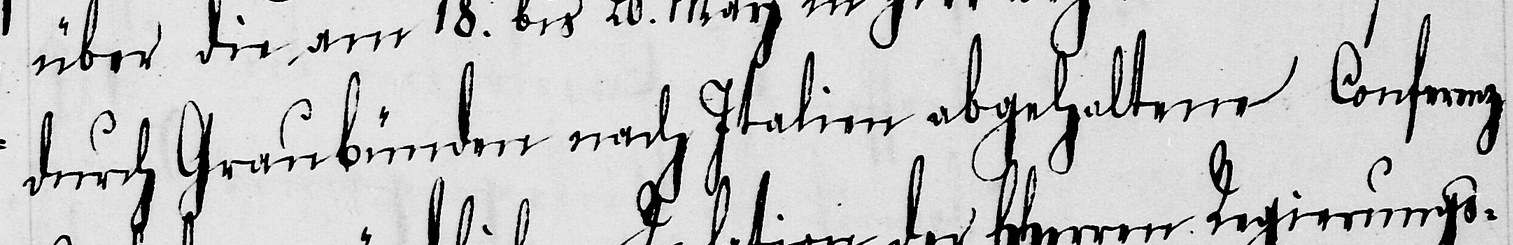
durch Graubünden nach Italien abgehaltenen Confere¬
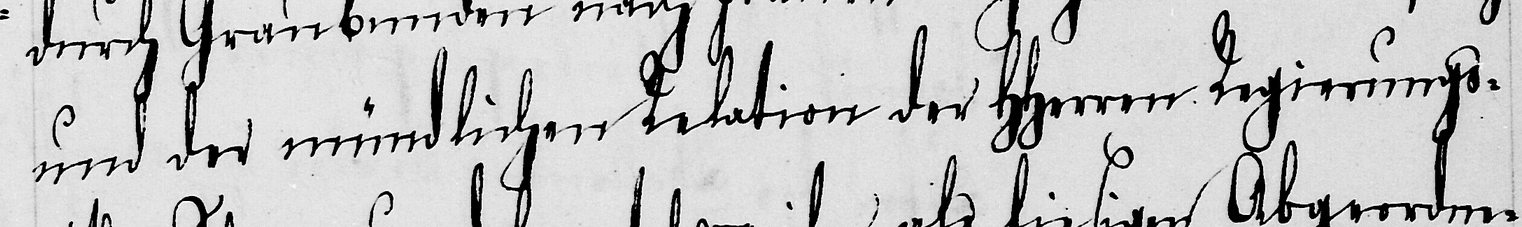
und der mündlichen Relation der HHerren Regierungs¬
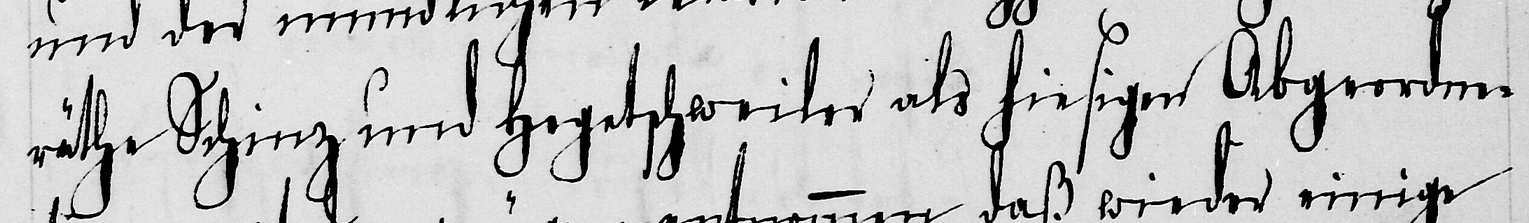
räthe Schinz und Hegetschweiler als hiesigen Abgeordne¬
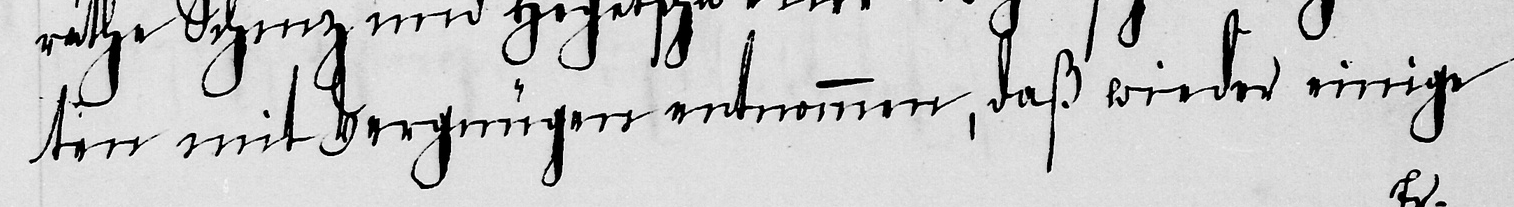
ten mit Vergnügen entnommen, daß wieder einige
